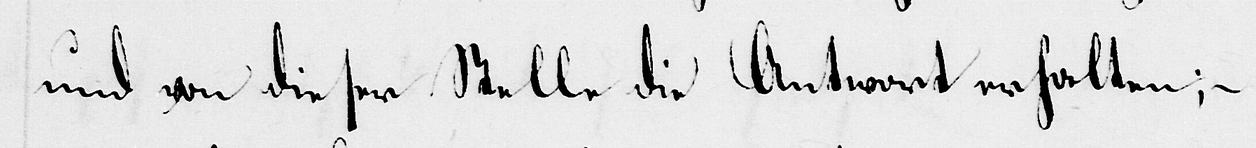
und von dieser Stelle die Antwort erhalten; –
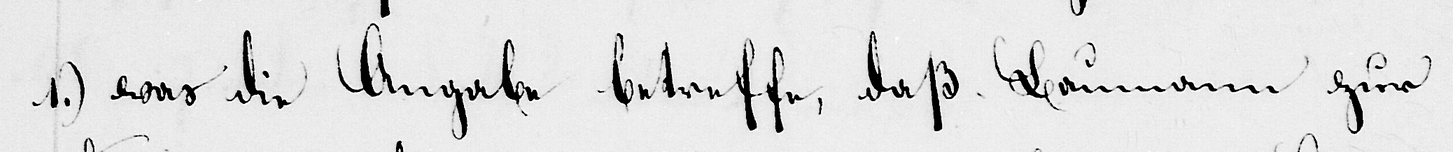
1.) was die Angabe betreffe, daß Baumann zur
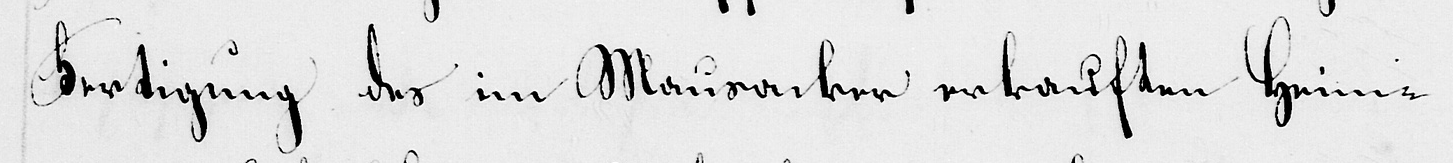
Fertigung des im Mausacker erkauften Heim¬
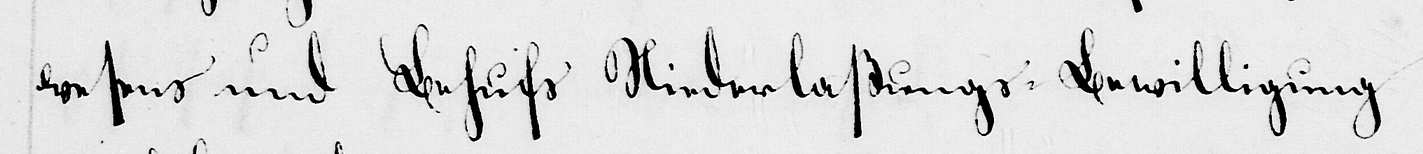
wesens und Behufs Niederlaßungs-Bewilligung
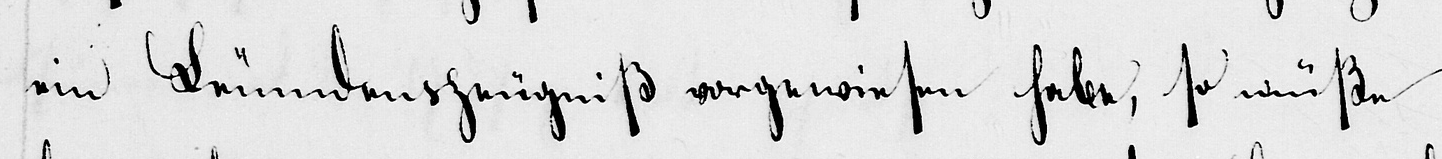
ein Leumdenszeugniß vorgewiesen habe, so müße
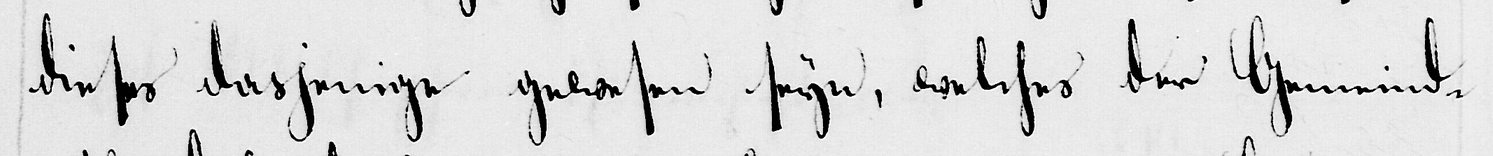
dieses dasjenige gewesen seyn, welches der Gemeind¬
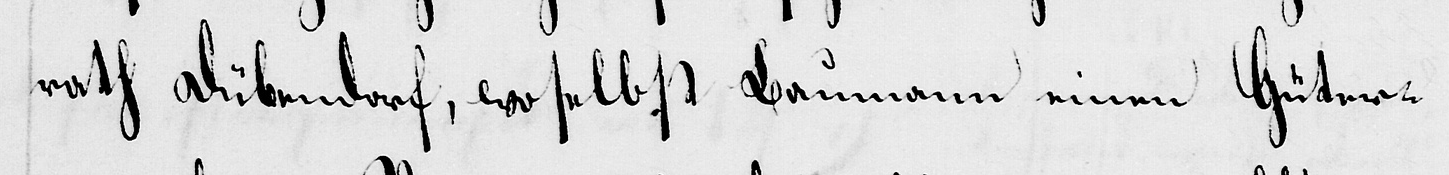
rath Dübendorf, woselbst Baumann einen Güter¬
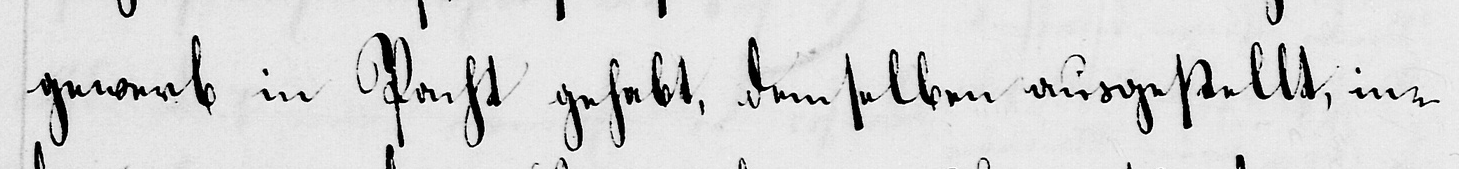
gewerb in Pacht gehabt, demselben ausgestellt, in¬
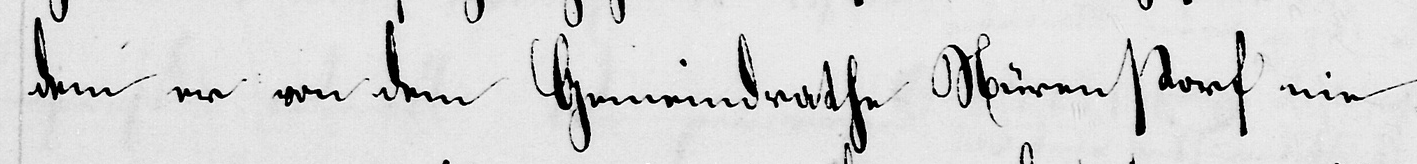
dem er von dem Gemeindrathe Nürensdorf nie
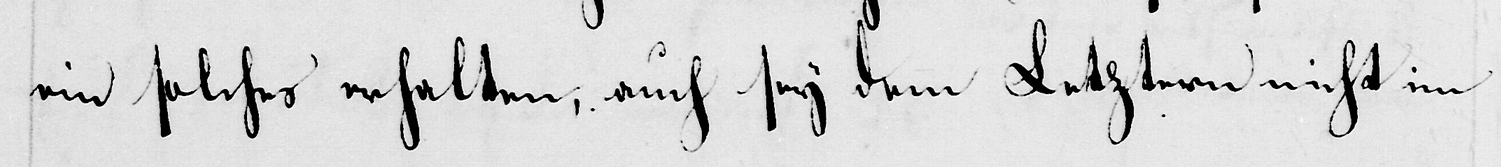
ein solches erhalten, auch sey dem Letztern nicht im
